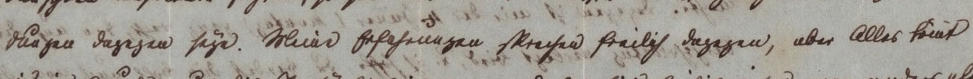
dungen dagegen seyn. Meine Erfahrungen sprechen freilich dagegen, aber Alles kömmt
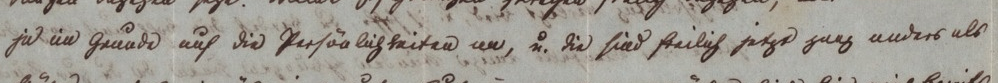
ja im Grunde auf die Persönlichkeiten an, u. die sind freilich jetzt ganz anders als
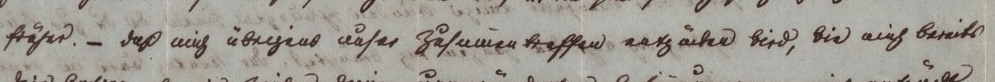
früher. – Daß mich übrigens unser Zusammentreffen entzücken wird, wie mich bereits
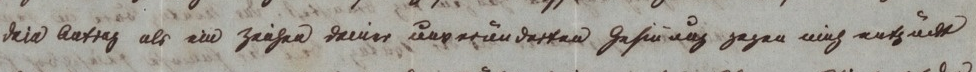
dein Antrag als ein Zeichen deiner unveränderten Gesinnung gegen mich entzückt
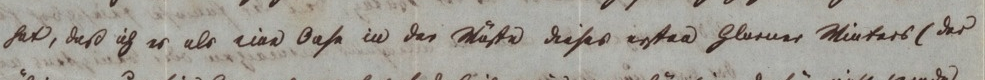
hat, daß ich es als eine Oase in der Wüste dieses ersten Glarner Winters (der
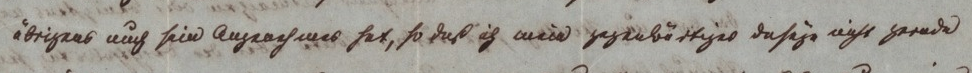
übrigens auch sein Angenehmes hat, so daß ich mein gegenwärtiges Daseyn nicht gerade
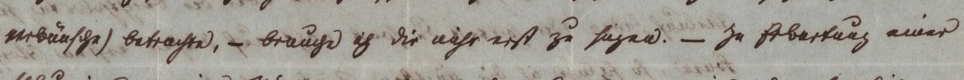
verwünsche) betrachte, – brauche ich dir nicht erst zu sagen. – In Erwartung einer
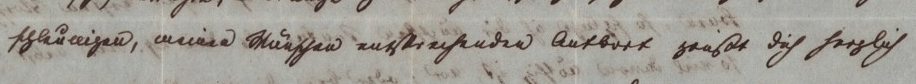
schleunigen, meinen Wünschen entsprechenden Antwort grüßt dich herzlich
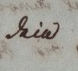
dein
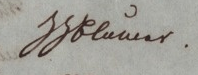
J J Blumer.
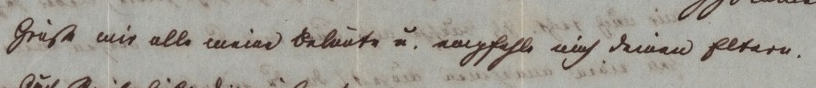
Grüsse mir alle meine Bekannte u. empfehle mich deinen Eltern.
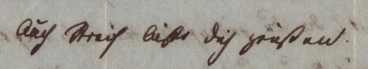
Auch Streif läßt dich grüßen.
